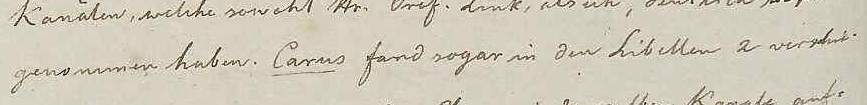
genommen haben. Carus fand sogar den Libellen 2 verschie-
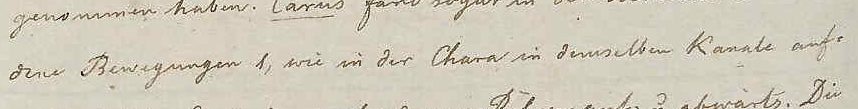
dene Bewegungen 1, wie in der Chara in demselben Kanale auf-
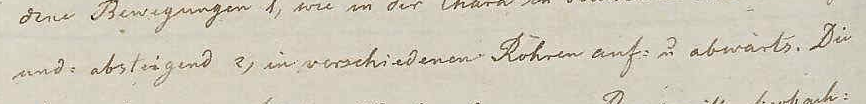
und absteigend 2, in verschiedenen Röhren auf- u abwärts. Die
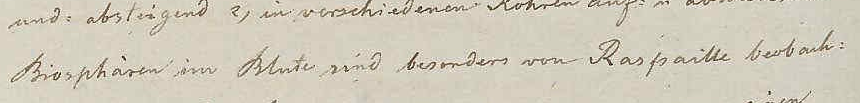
Biosphären im Blute sind besonders von Raspaille beobach-
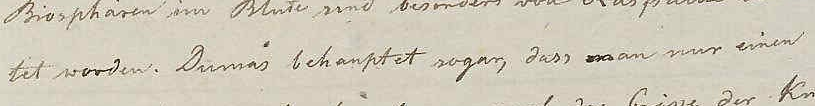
tet worden. Dumas behauptet sogar, dass man nur einen
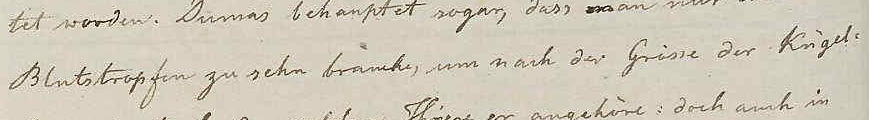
Blutstropfen zu sehn brauche, um nach der Grösse der Kügel-
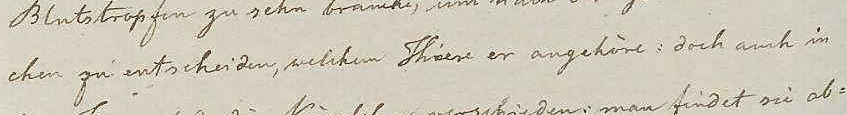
chen zu entscheiden, welchem Thiere er angehöre: doch auch in
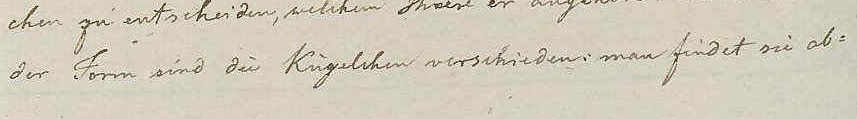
der Form sind die Kügelchen verschieden: man findet sie ab-
